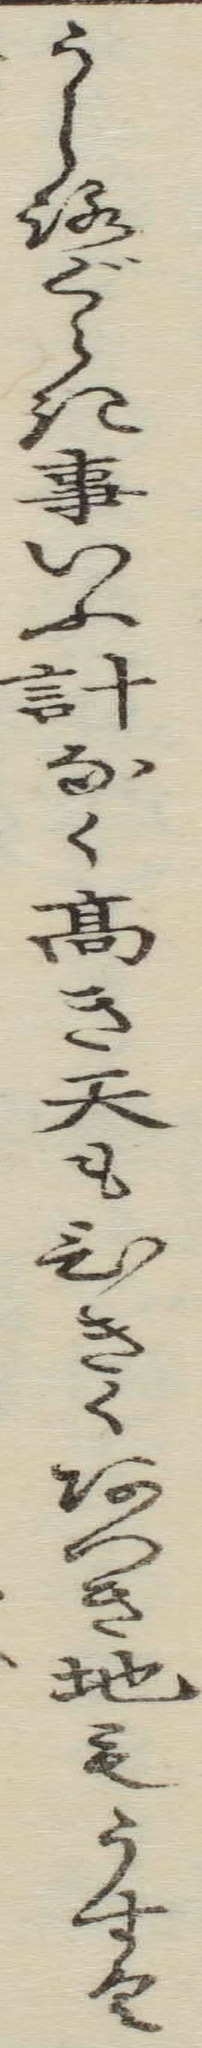うしろぐらき事いふ計なく高き天もひきくあつき地もうすく
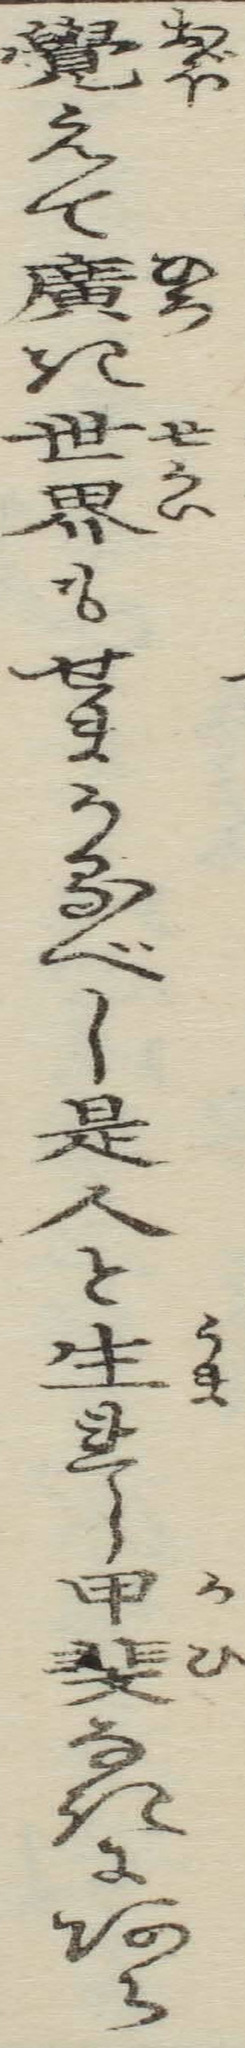覚えて広き世界もせまかるべし是人と生れし甲斐なきにあら
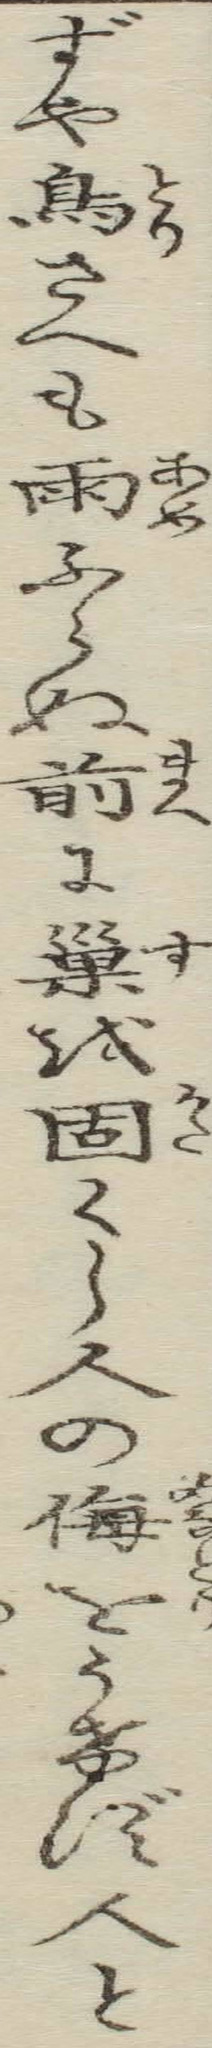ずや鳥さへも雨ふらぬ前に巣を固くし人の侮をうけず人と
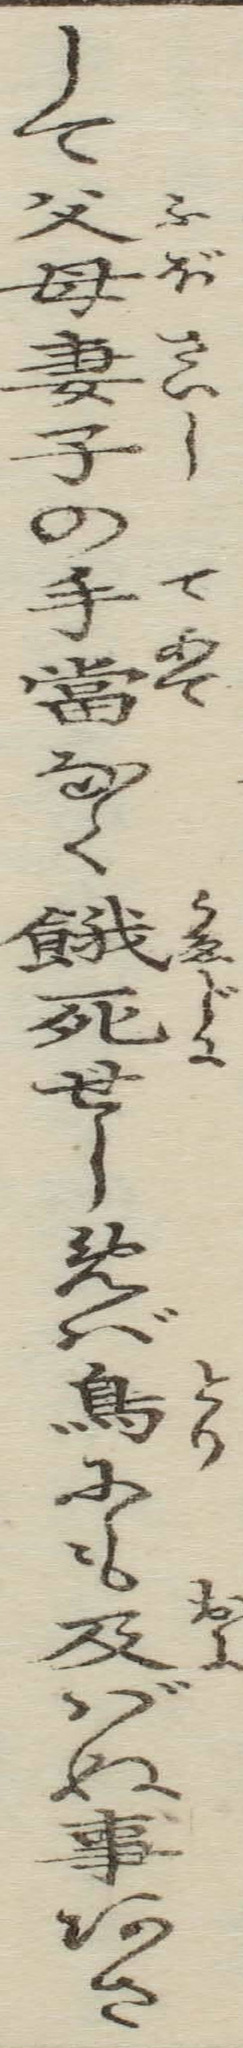して父母妻子の手当なく餓死せしめば鳥にも及ばぬ事あさ
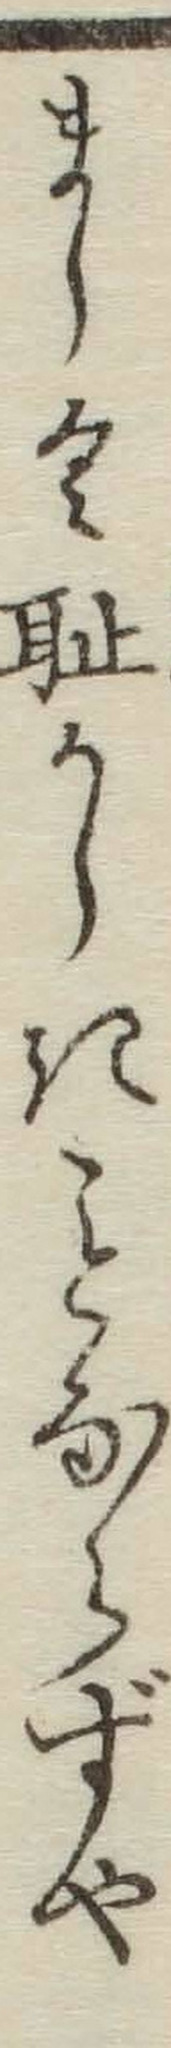ましく耻かしきことならずや
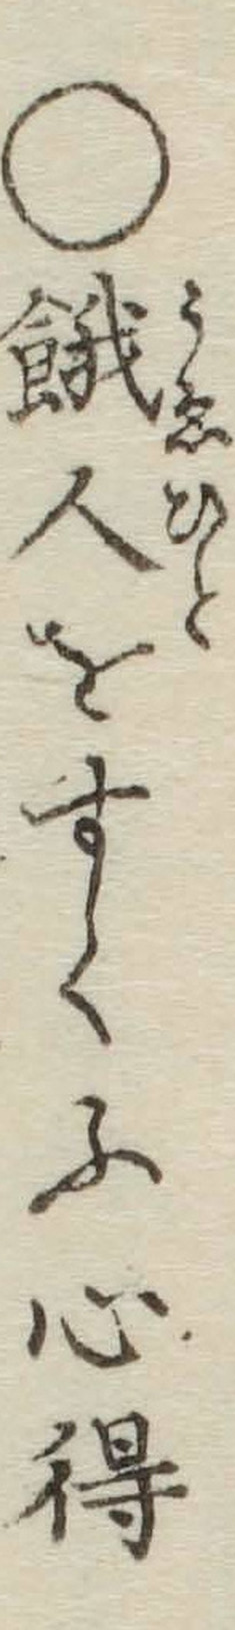○餓人をすくふ心得
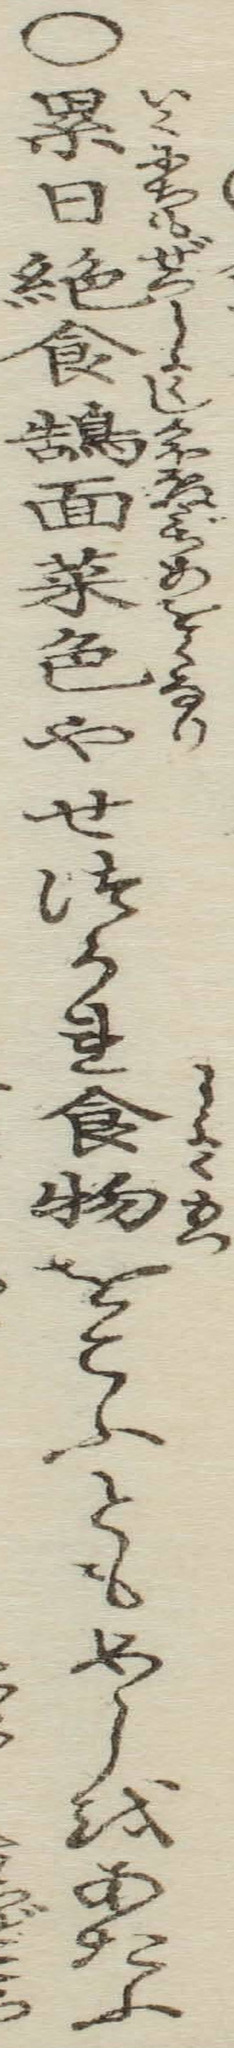○累日絶食鵠面菜色やせつかれ食物をこふともめしをあたふ
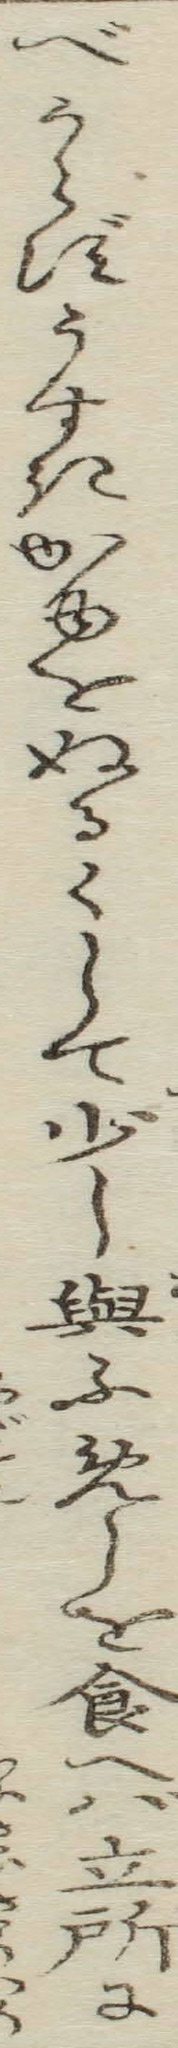べからずうすきかゆをぬるくして少し与ふめしを食へば立所に
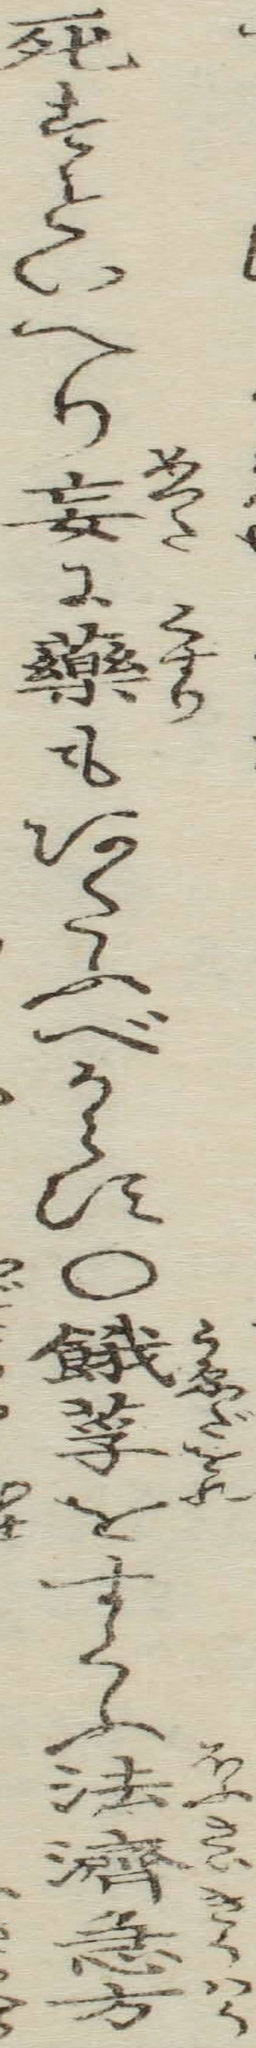死すといへり妄に薬もあたふべからす○餓莩をすくふ法濟急方
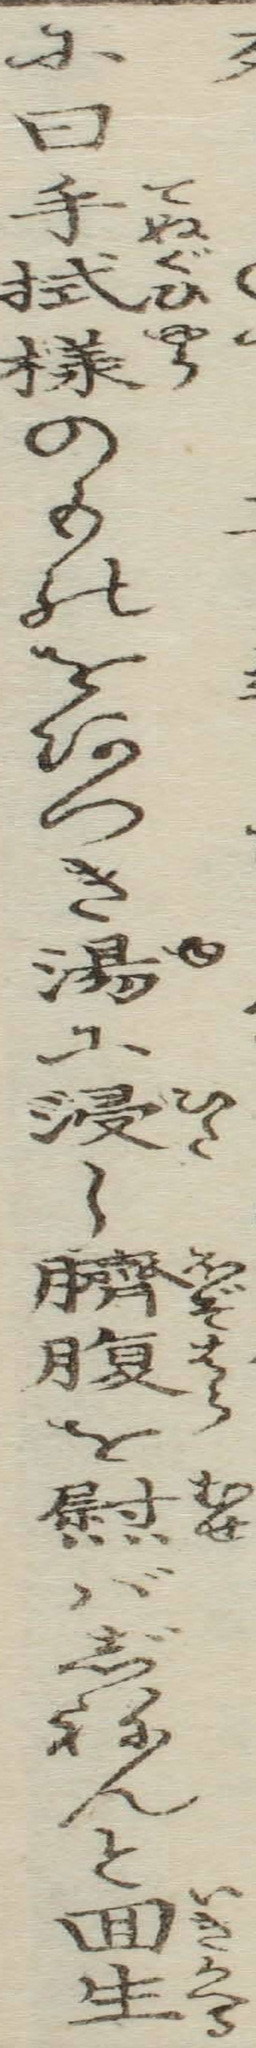に曰手拭様のものをあつき湯に浸し臍腹を熨ばじねんと回生

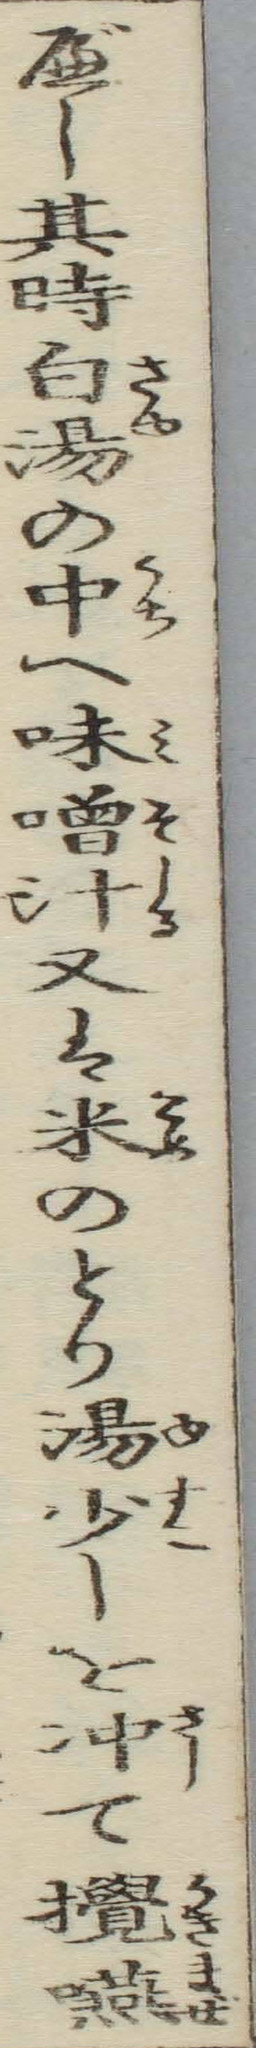べし其時白湯の中へ味噌汁又は米のとり湯少しを冲て攪嚥
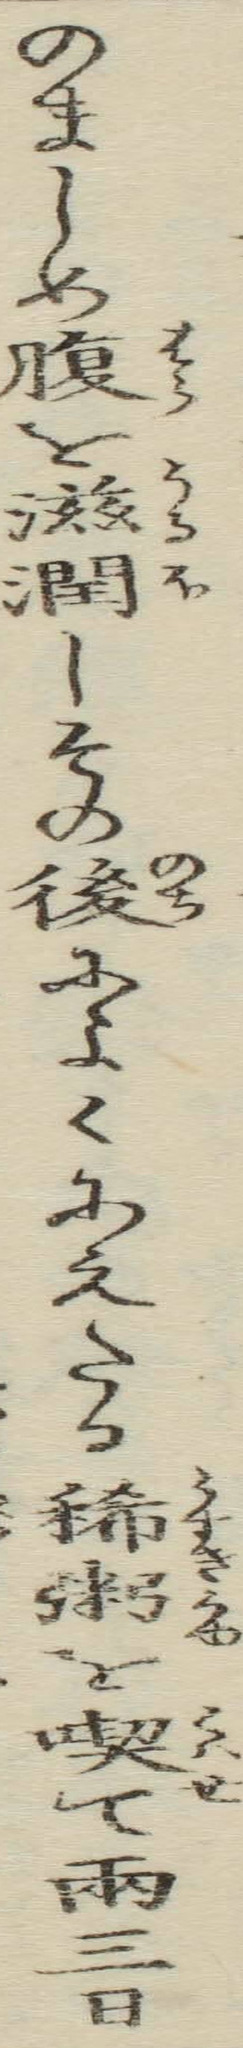のましめ腹を滋潤しその後によくにえたる稀粥を喫て両三日
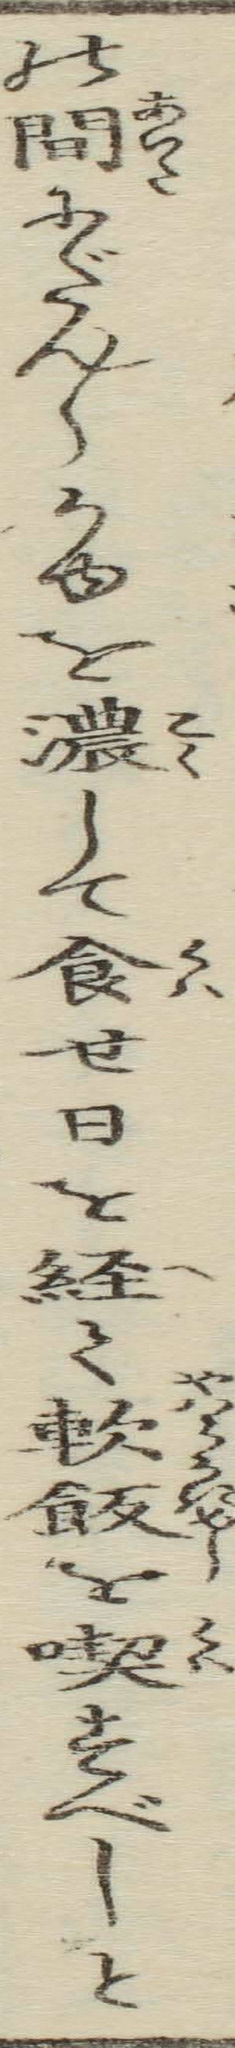の間にだん〳〵かゆを濃して食せ日を経て軟飯を喫すべしと
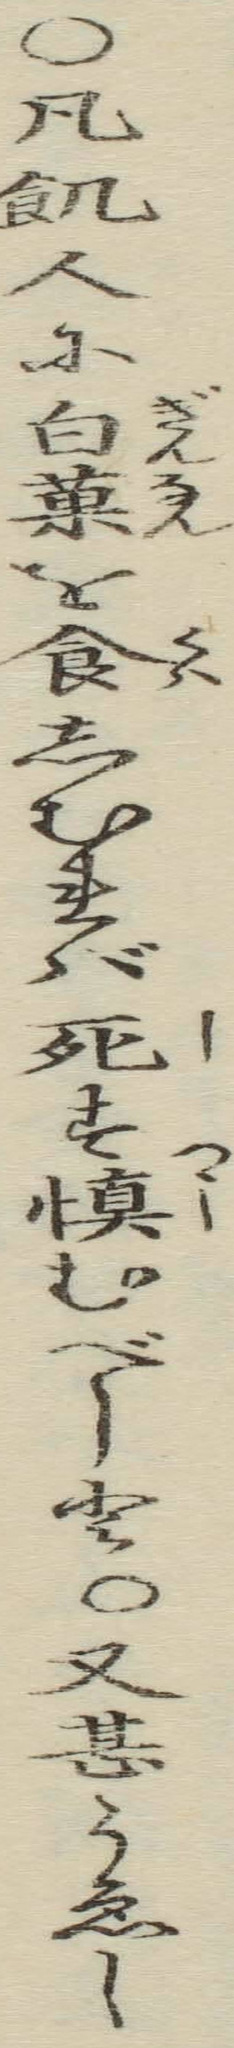○凡飢人に白菓を食しむれば死す慎むべしと○又甚うゑし
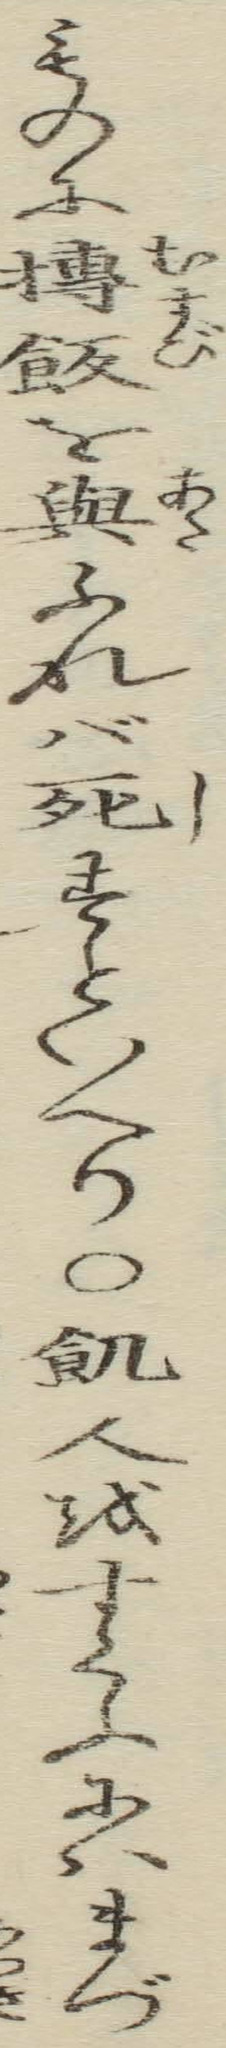ものに摶飯を与ふれば死すといへり○飢人をすくふにはまづ
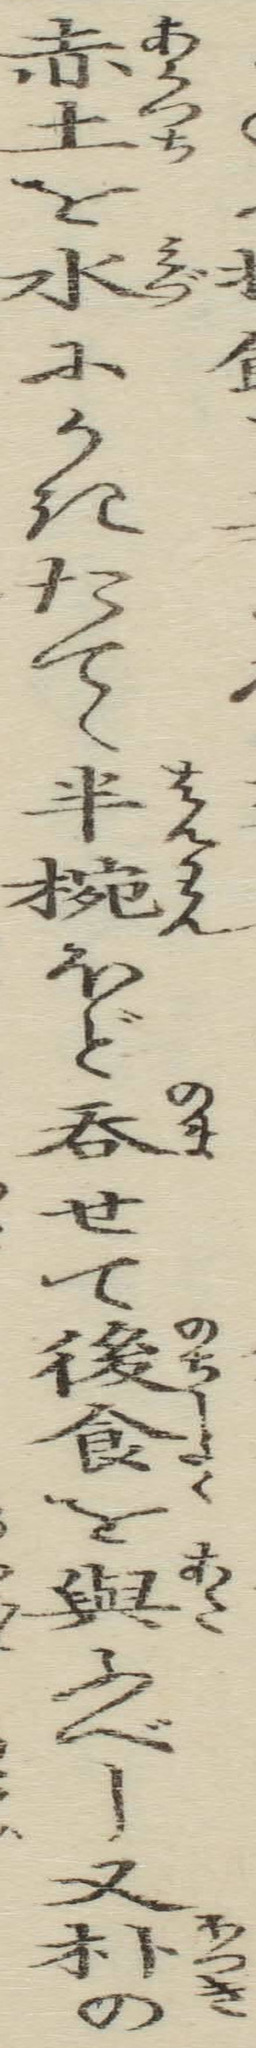赤土を水にかきたてゝ半椀ほど呑せて後食を与ふべし又朴の
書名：救荒便覧
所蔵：国文学研究資料館
